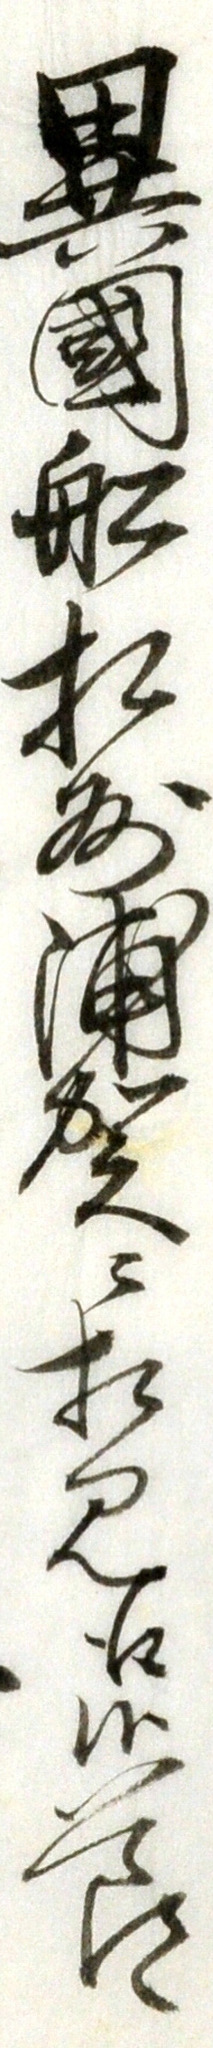異国船相州浦賀ニ相見え候節
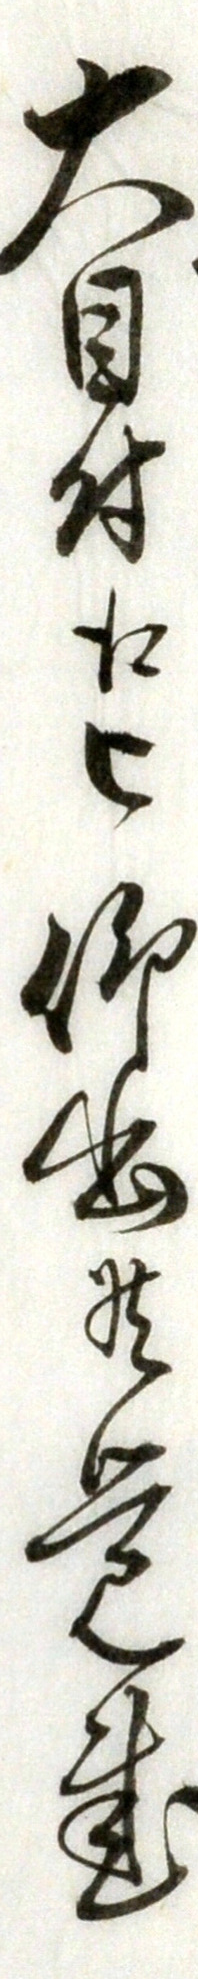大目付え被仰出候覚書

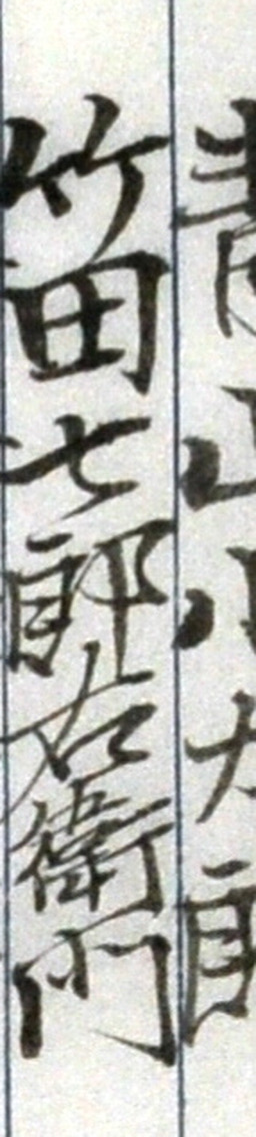竹田七郎右衛門
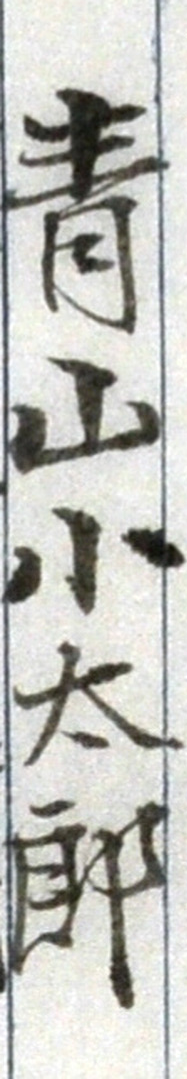青山小太郎
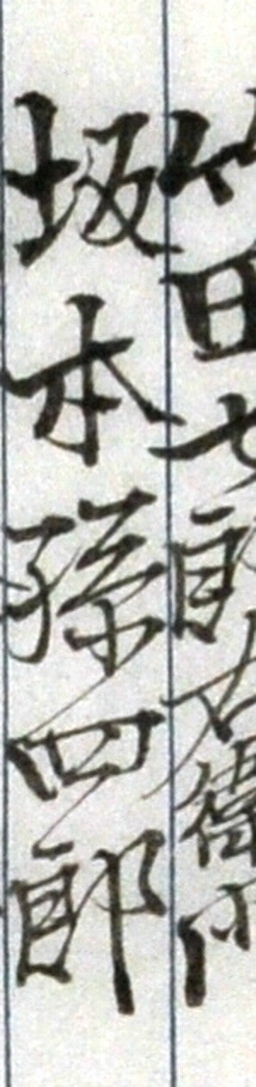坂本孫四郎
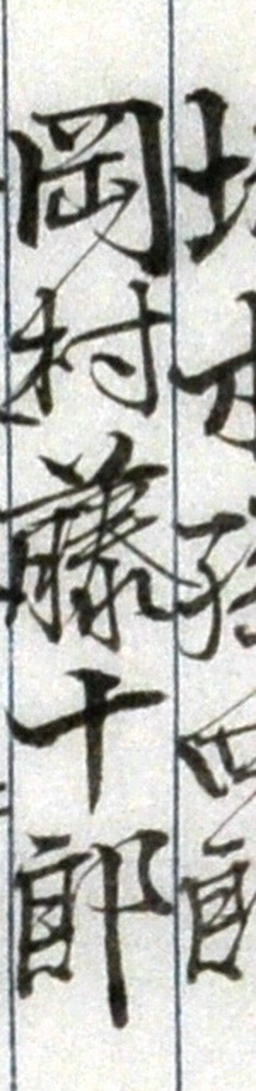岡村藤十郎
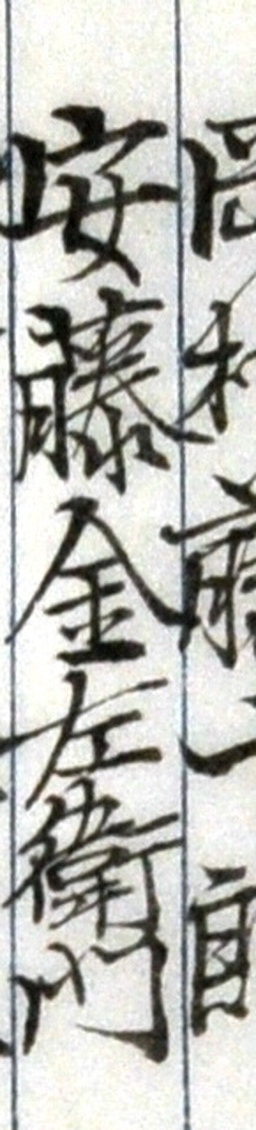安藤金左衛門
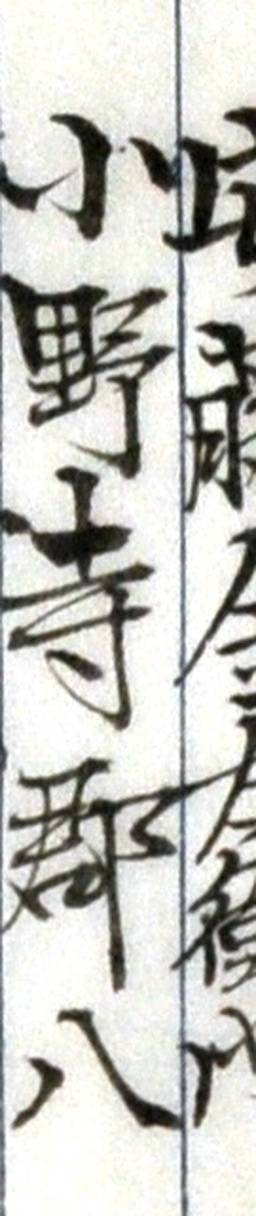小野寺郡八
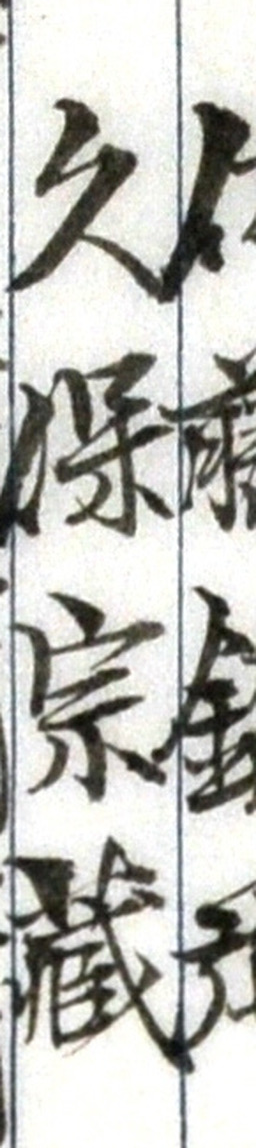久保宗蔵
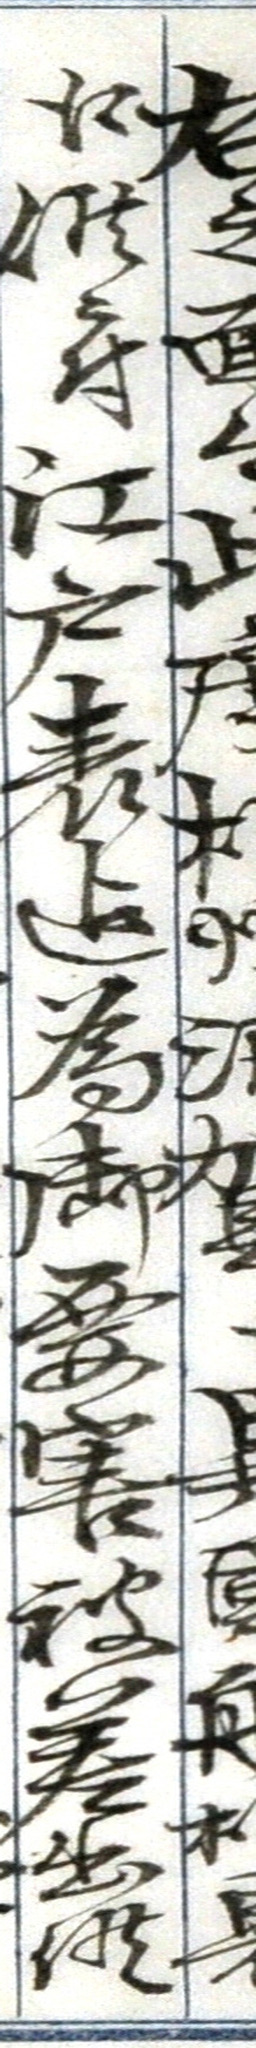え候に付江戸表迄為御要害被差出候
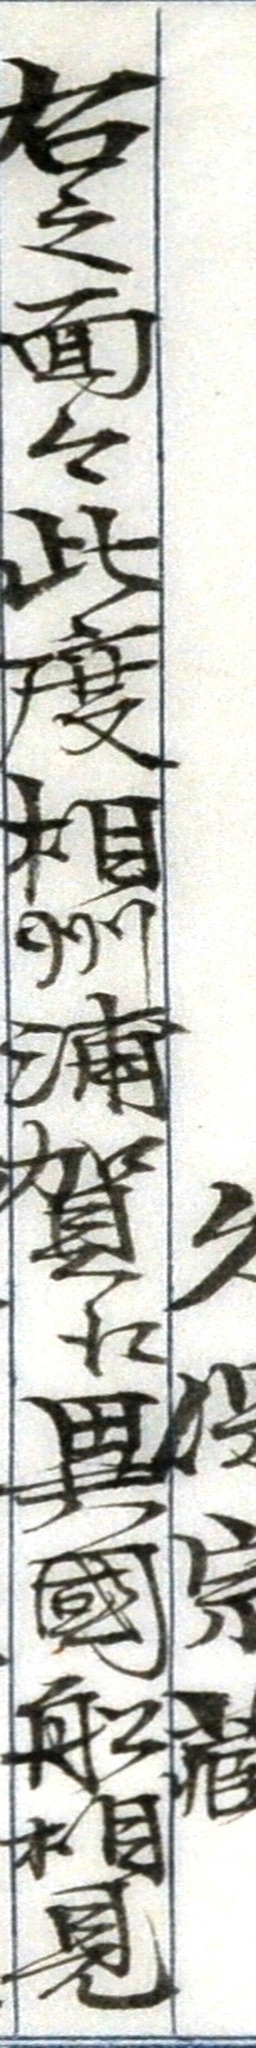右之面々此度相州浦賀え異国船相見
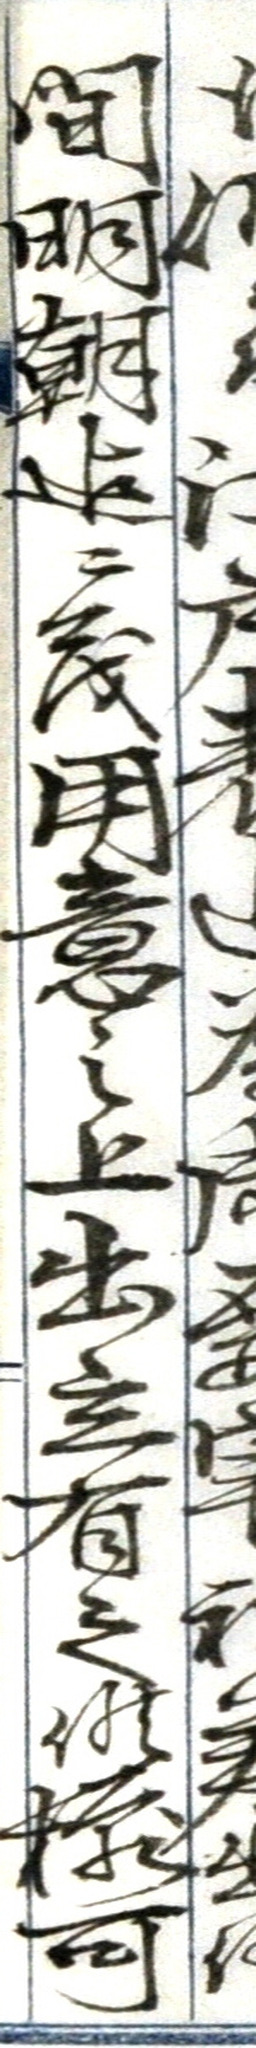間明朝迄にも用意之上出立有之候様可

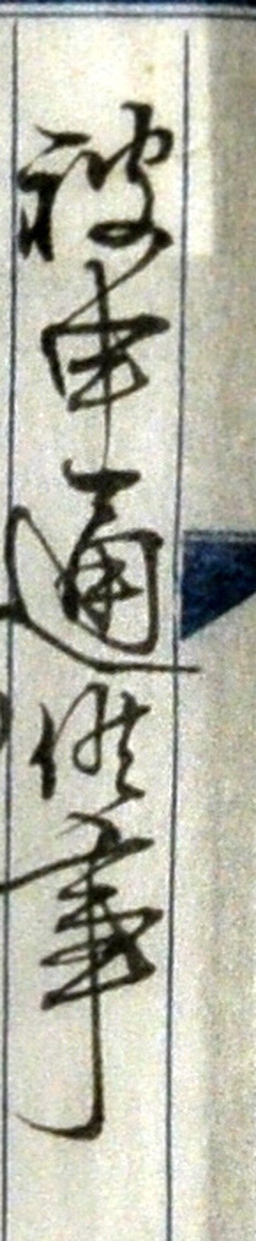被申通候事
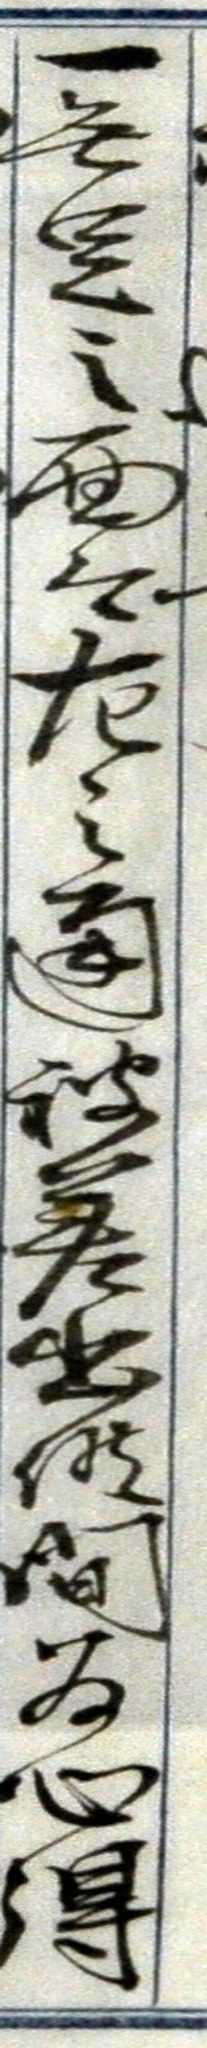一無足之面々左之通被差出候間為心得
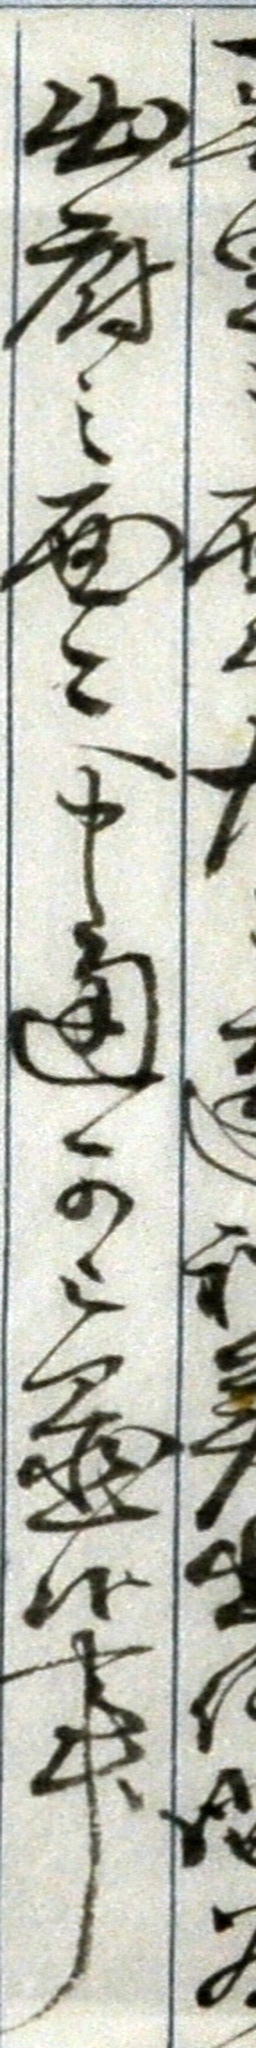出府之面々へ申通可被置候事
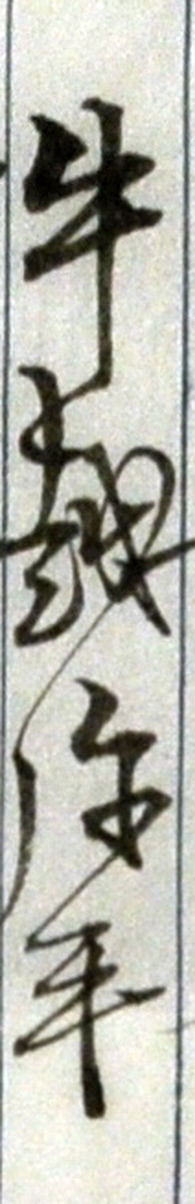牛越弥平
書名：異国船相州浦賀ニ相見エ候節大目付ヘ被仰出候覚書
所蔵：伊那市立高遠町図書館・合同会社AMANE
